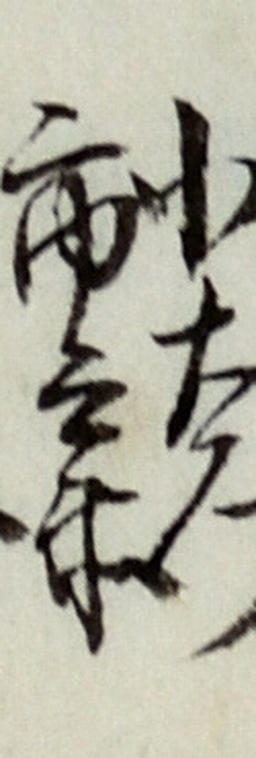市兵衛
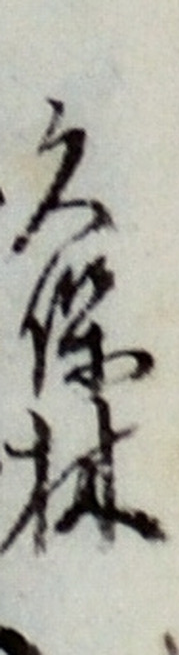久保林
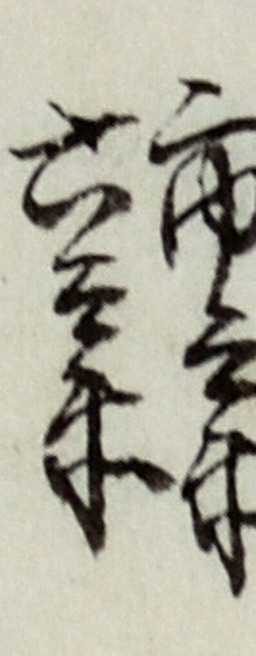六兵衛
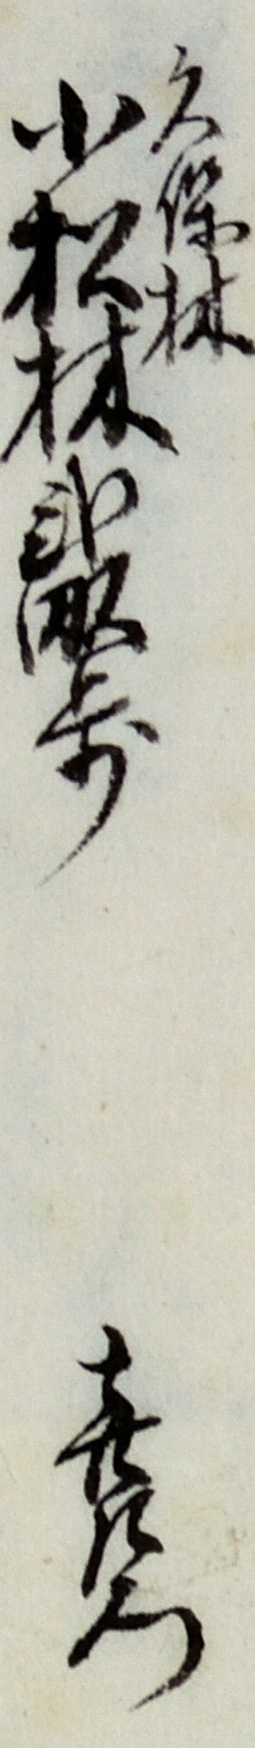小松林弐畝歩喜左衛門
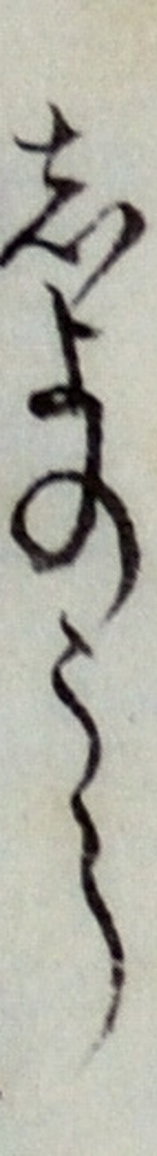しよのうら
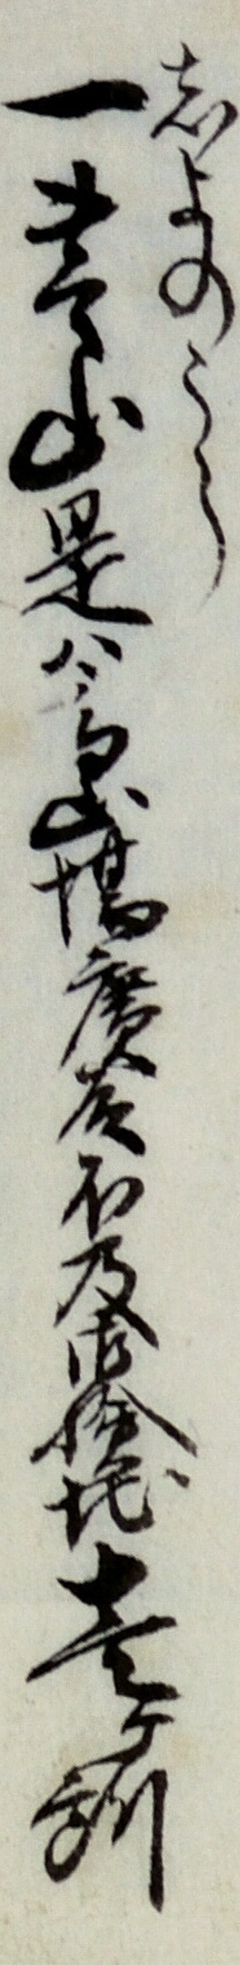一芝山是ハ高山場広殿不及御検地壱ヶ所
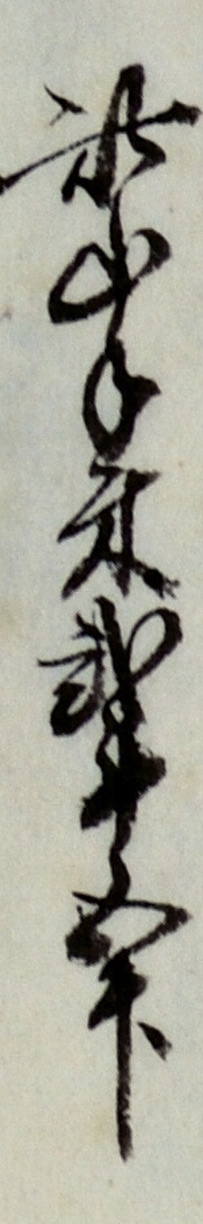此山手米弐斗五升

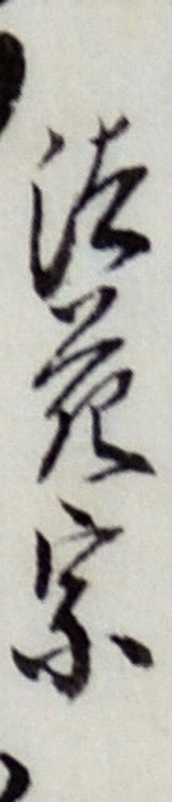法華宗
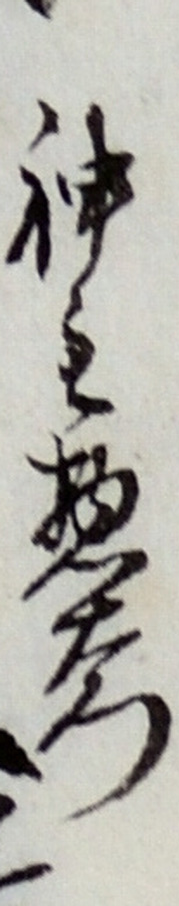神主惣右衛門
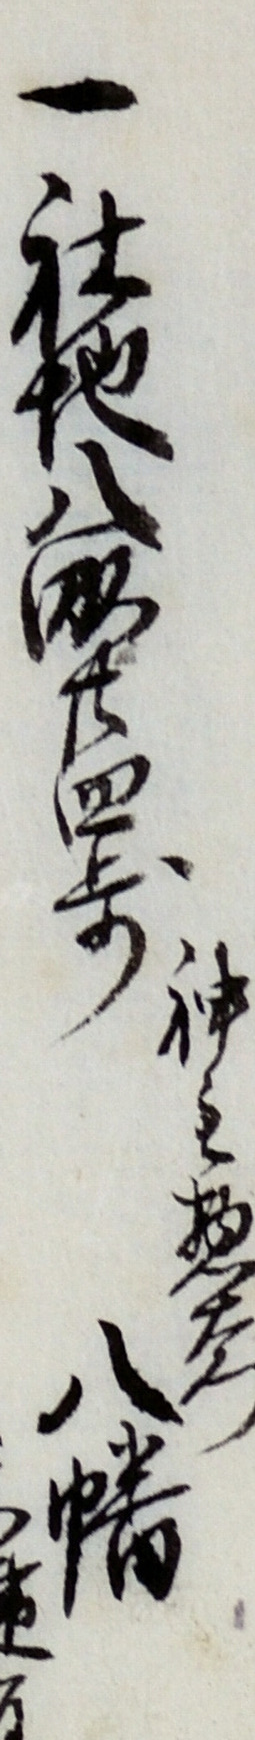一社地八畝廿四歩八幡
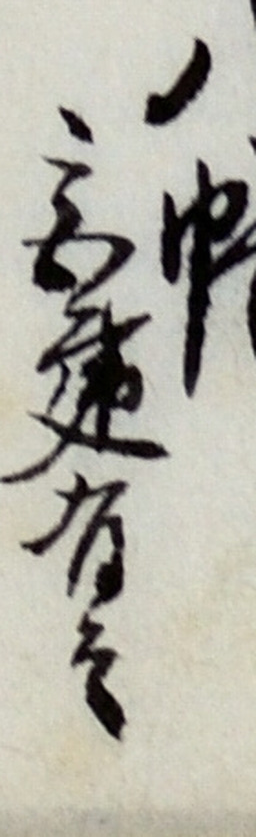宮建有之
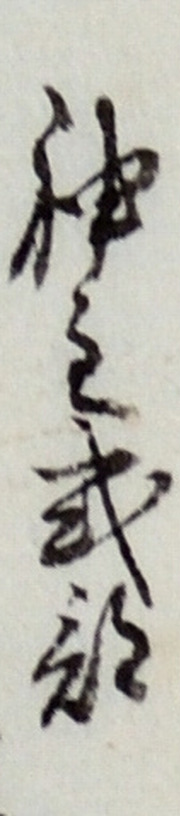神主式部
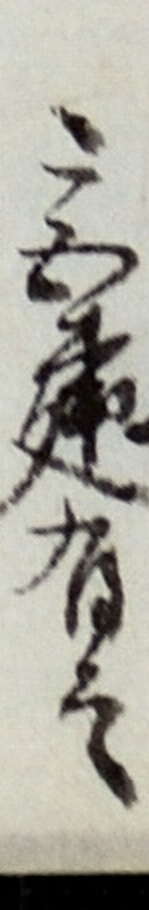宮建有之
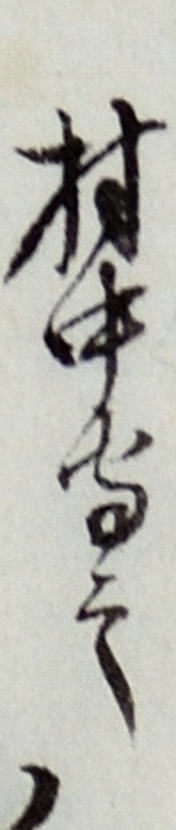村中守之
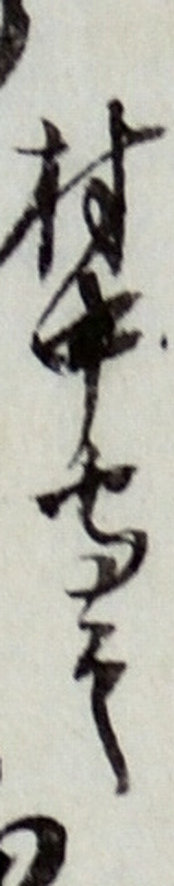村中守之
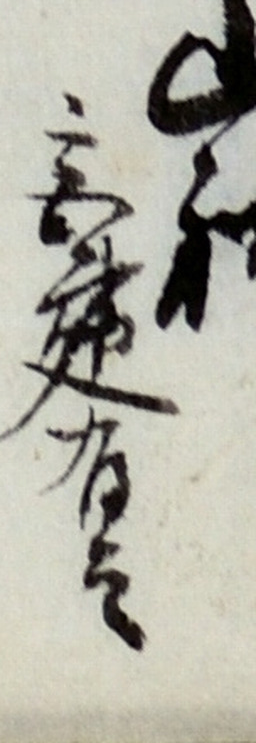宮建有之
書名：御領分中山林社地手控
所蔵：伊那市立高遠町図書館・合同会社AMANE
